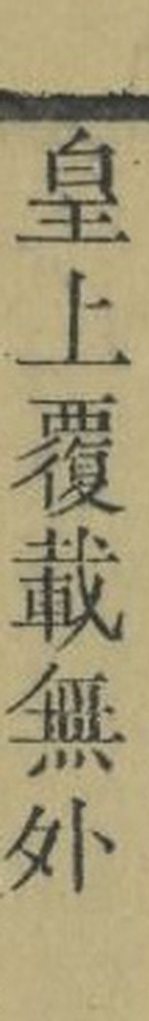皇上覆載無外
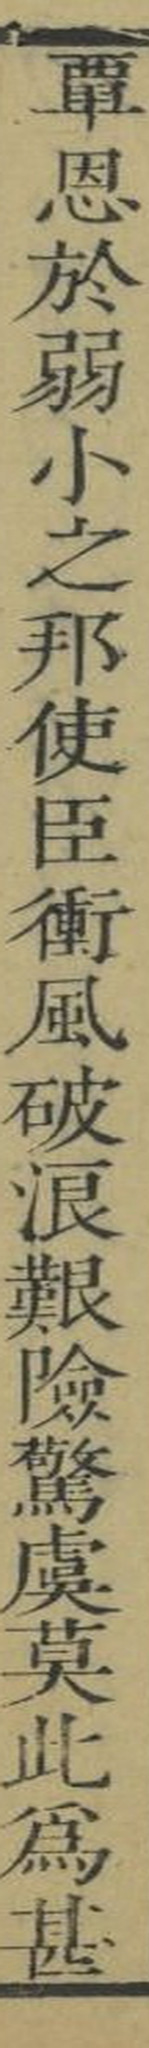覃恩於弱小之邦使臣衝風破浪艱險驚虞莫此爲甚
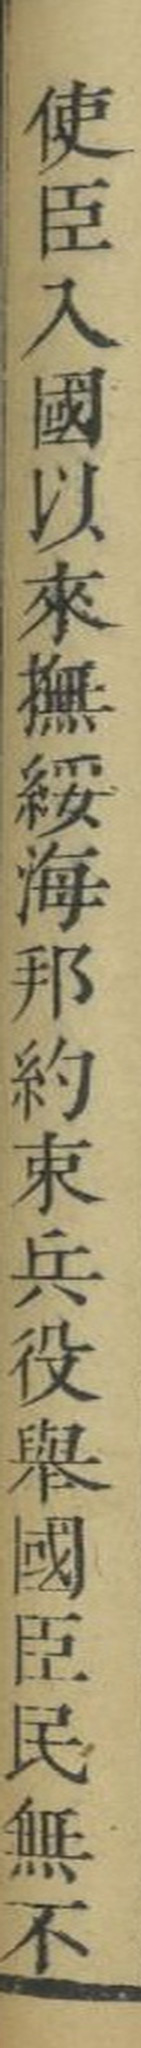使臣入國以來撫綏海邦約束兵役舉國臣民無不
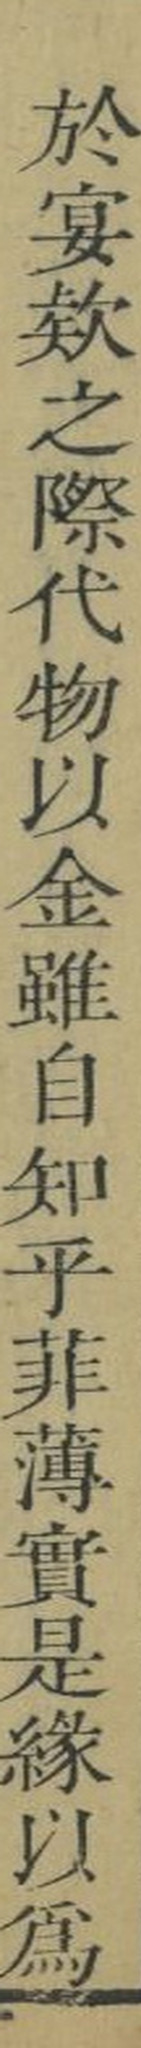於宴欵之際代物以金雖自知乎菲薄實是緣以爲
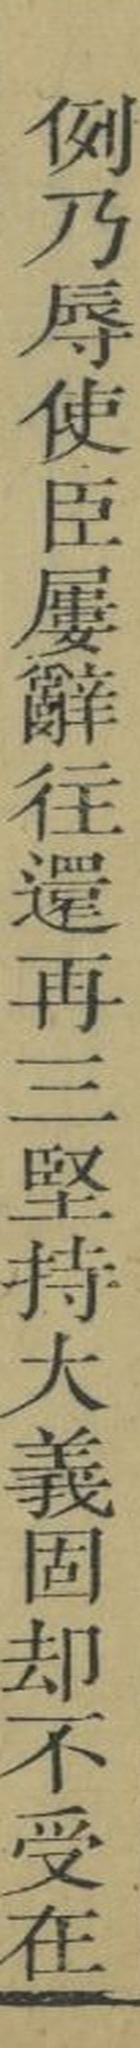例乃辱使臣屢辭往還再三堅持大義固却不受在
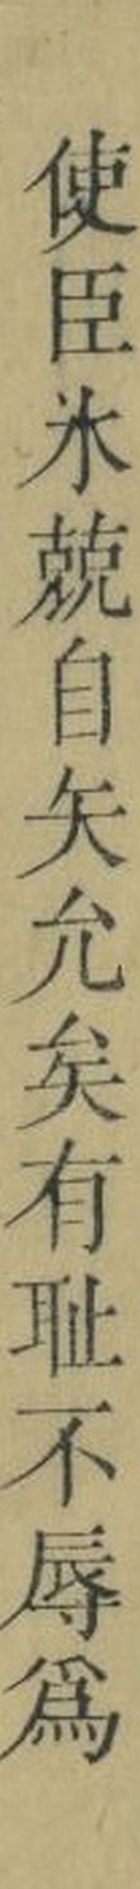使臣氷兢自矢允矣有耻不辱爲
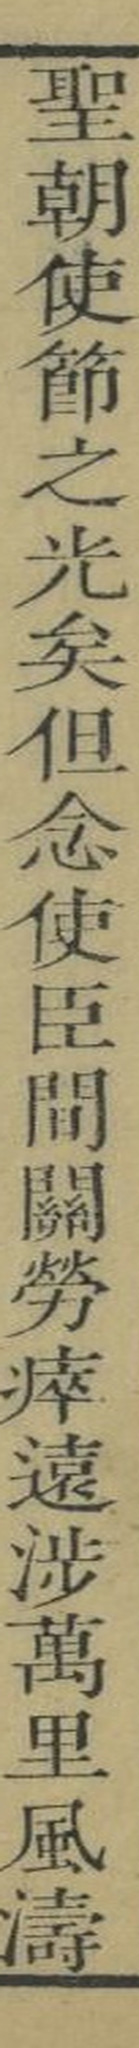聖朝使節之光矣但念使臣間關勞瘁遠涉萬里風濤
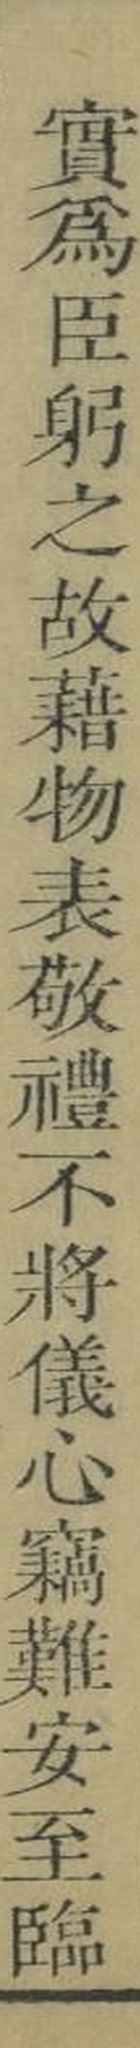實爲臣躬之故藉物表敬禮不將儀心竊難安至臨
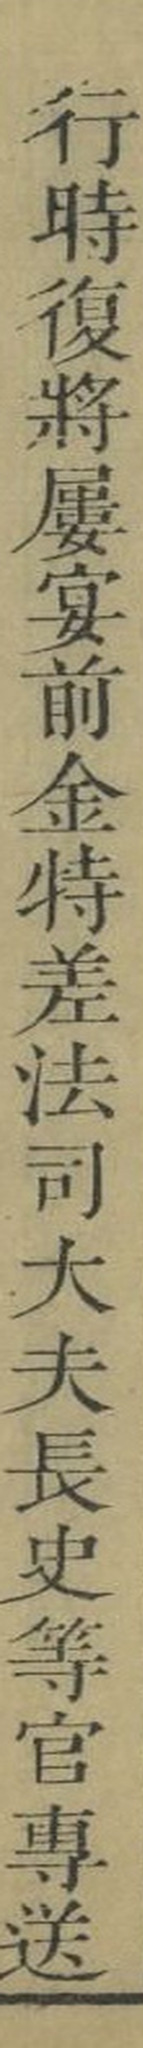行時復將屢宴前金特差法司大夫長史等官專送
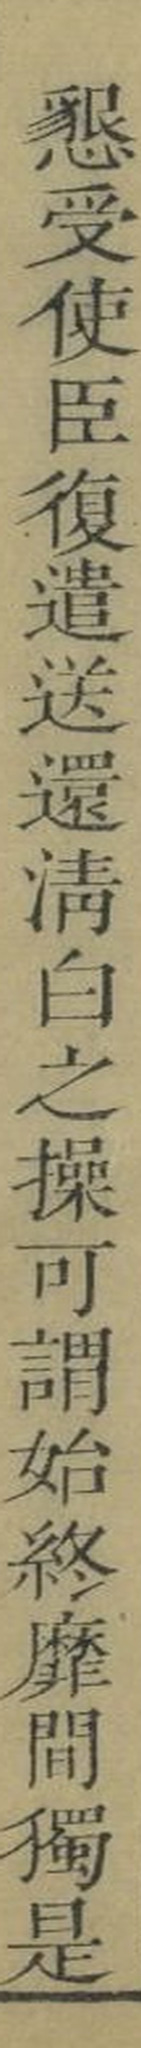懇受使臣復遣送還淸白之操可謂始終靡間獨是
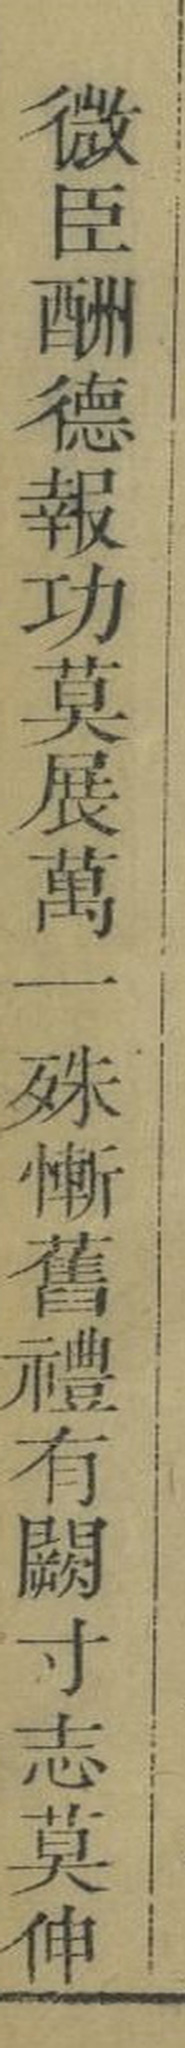微臣酬德報功莫展萬一殊慚舊禮有闕寸志莫伸

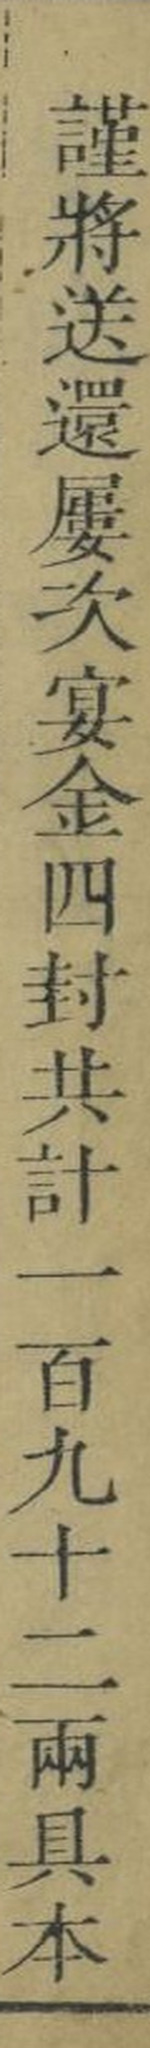謹將送還屢次宴金四封共計一百九十二兩具本
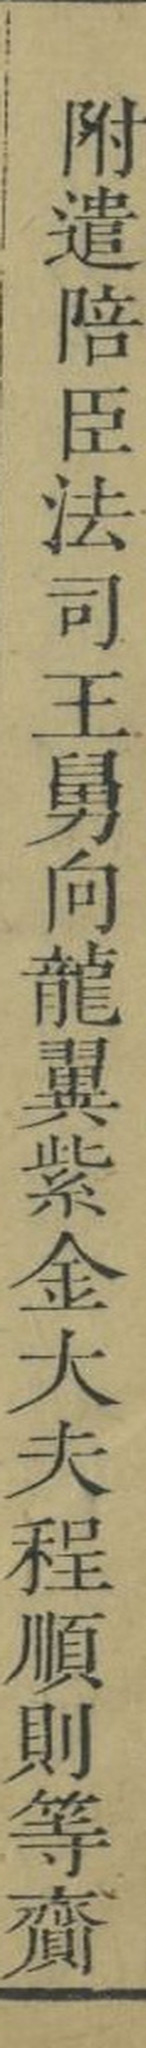附遣陪臣法司王舅向龍翼紫金大夫程順則等齎
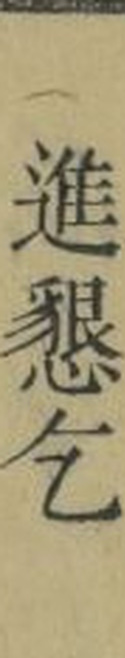進懇乞
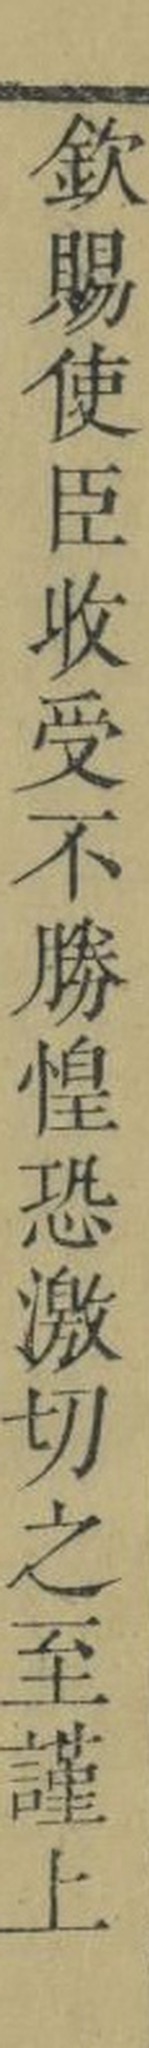欽賜使臣收受不勝惶恐激切之至謹上
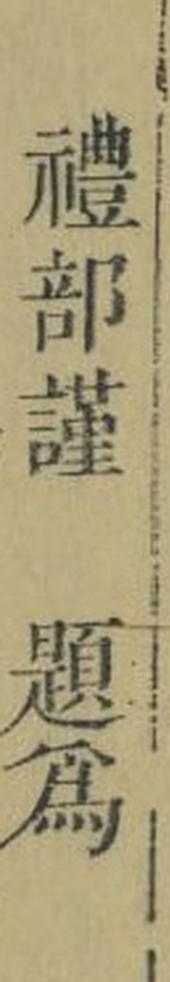禮部謹題爲
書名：中山伝信録 巻二
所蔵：University of the Ryukyus Library
